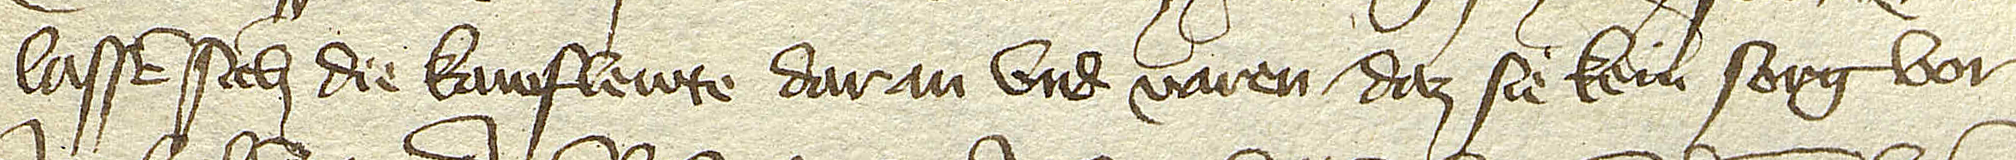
laſſe* ſich die kawflewte daran vnd varen / daʒ ſie kein ſorg vor
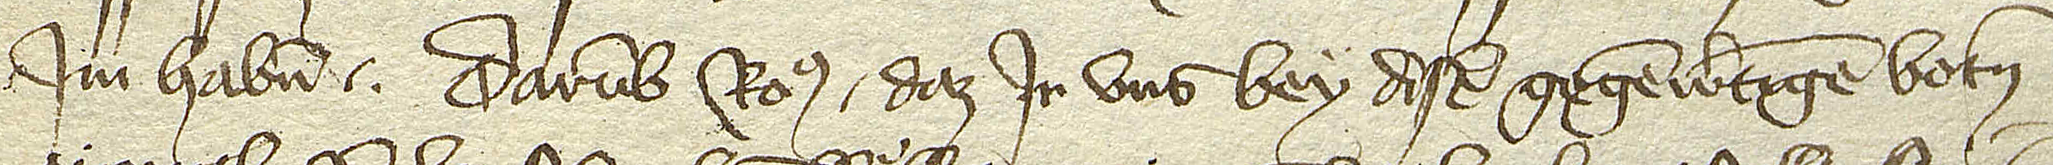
Im habn* / . Daru*b Ro* / daʒ Ir vns bey diſe* gege*w*tige* botn*
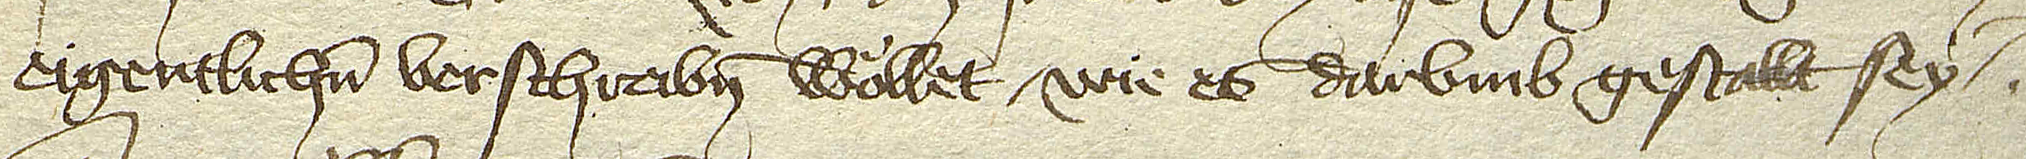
eigentlichn* verſchreibn* wöllet / wie es darvmb geſtallt ſey / .
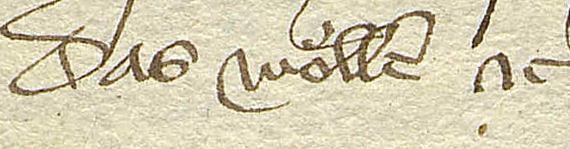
Das wölle* ec*
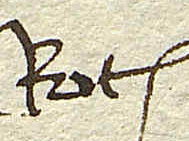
Rot*
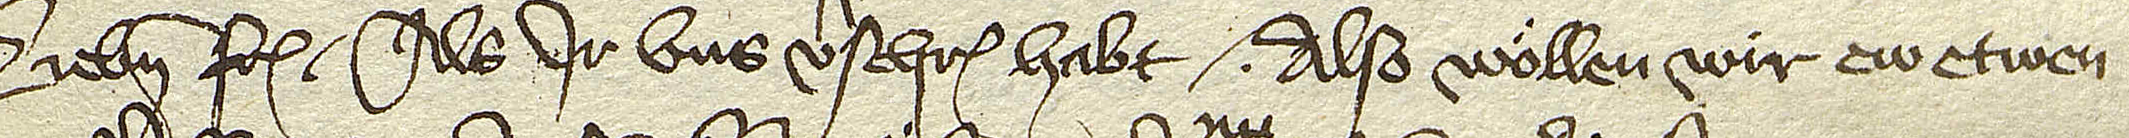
Liebn* fr* / Als Ir vns v*ſchr* habt / . Alſo wöllen wir ew etwen
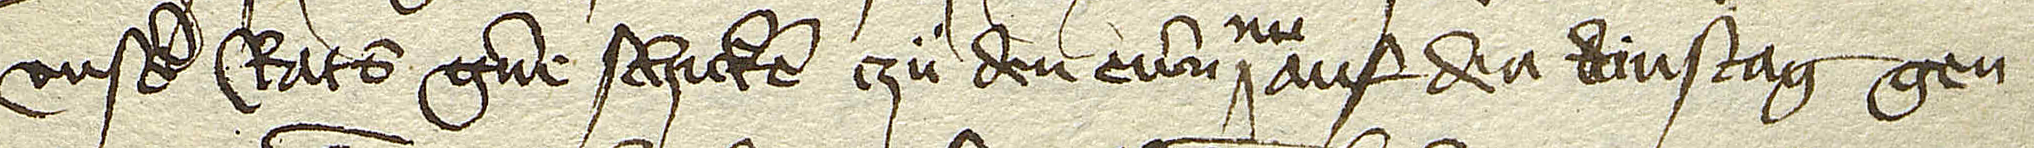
vnſs* Rats gn*e ſchicke* cʒü den ew*n auf den dinſtag gen
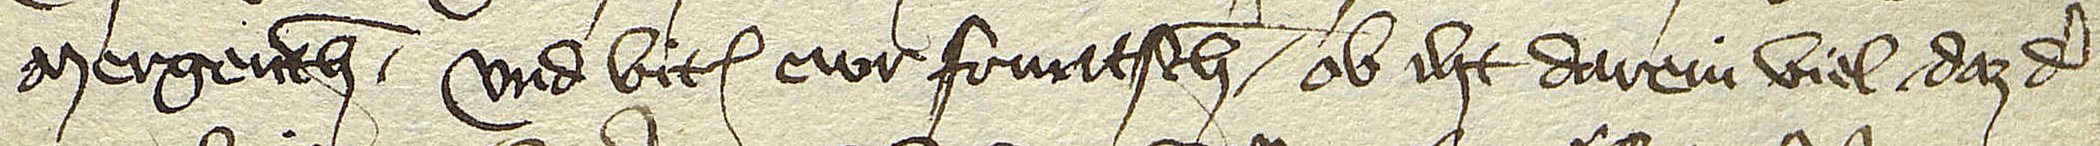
Mergenth* / vnd bit* ewr fruntſch* / ob iht darein viel / daʒ d*
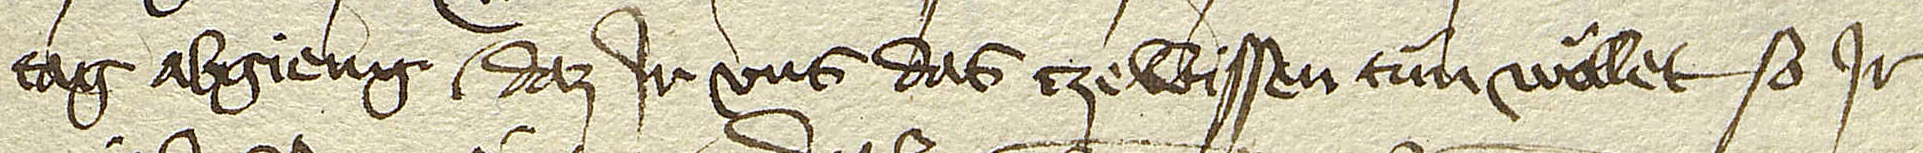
tag abgieng / daʒ Ir vns das cʒewiſſen tün wöllet ſo Ir
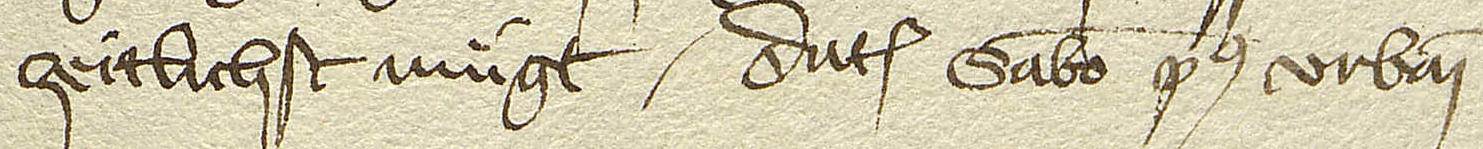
cʒeitlichſt mügt / Dat* Sabo* p* vrbai*
